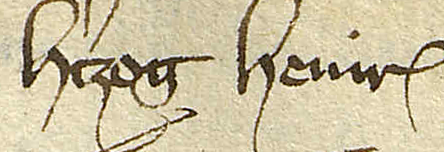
h*cʒog heinr*
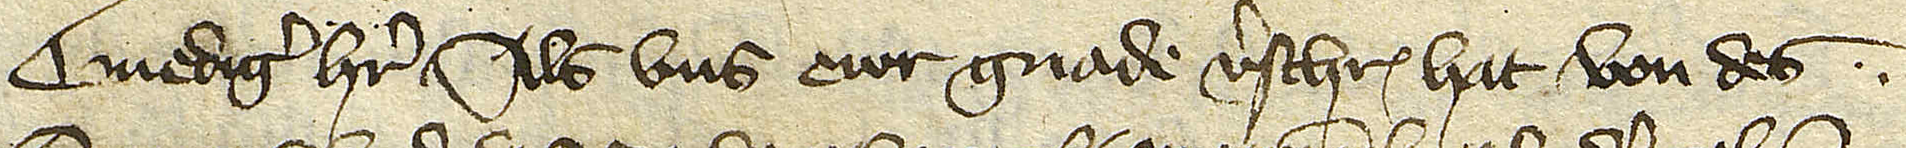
Gnedig* hr* / Als vns ewr gnade v*ſchr* hat / von des
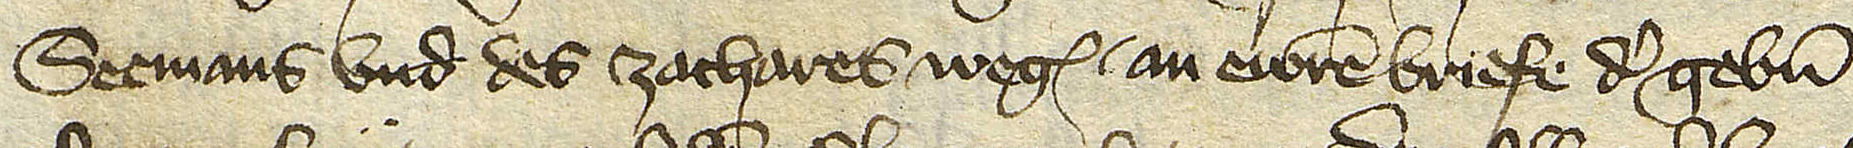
Seemans vnd des cʒachares weg* / an ewre* briefe d* gebn*
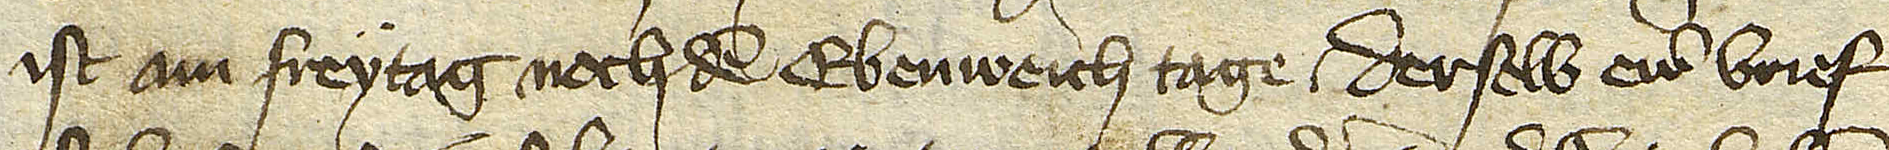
iſt am freytag noch d* Ebenweich tage / derſelb ew* brief
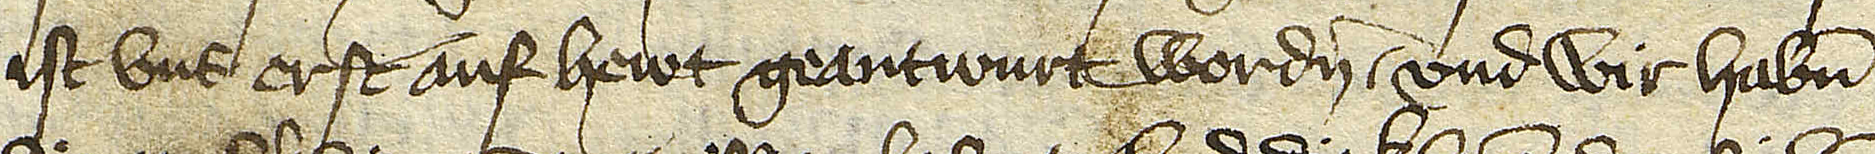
iſt vns erſt auf hewt geantwurt wordn* / vnd wir habn*
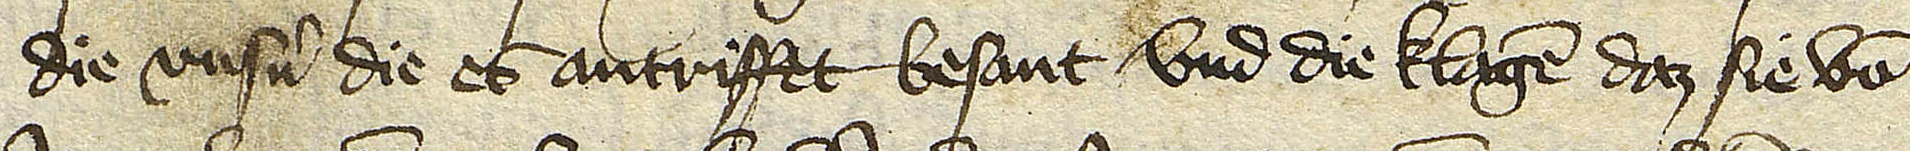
die vnſn* die es antriffet beſant / vnd die klage* daʒ ſie vo*
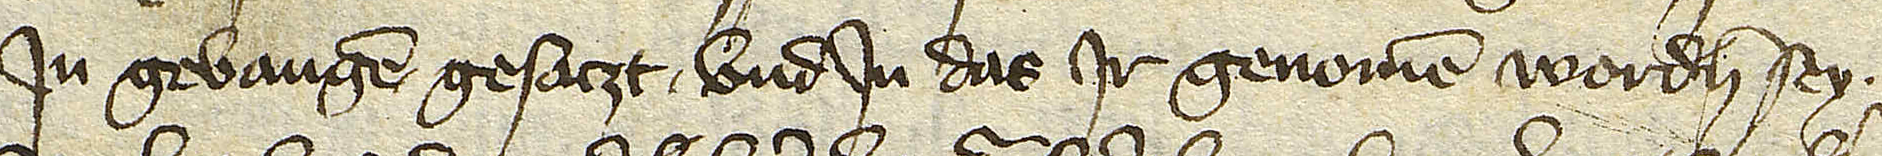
In gevange* geſacʒt / vnd In das Ir genome* wordn* ſey .
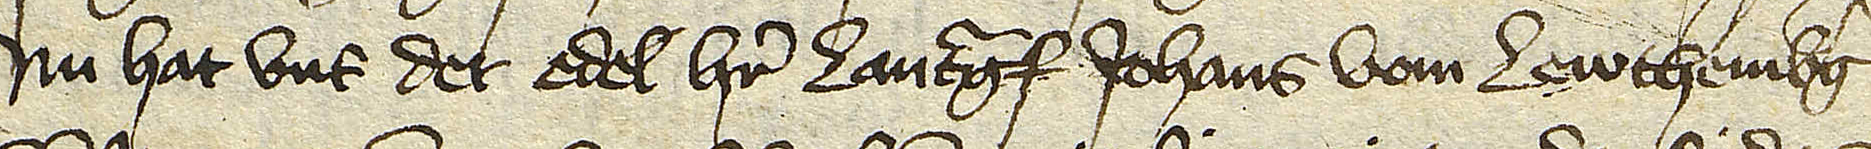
Nu hat vns der edel hr* Lantg*f Iohans vom Lewthembg*
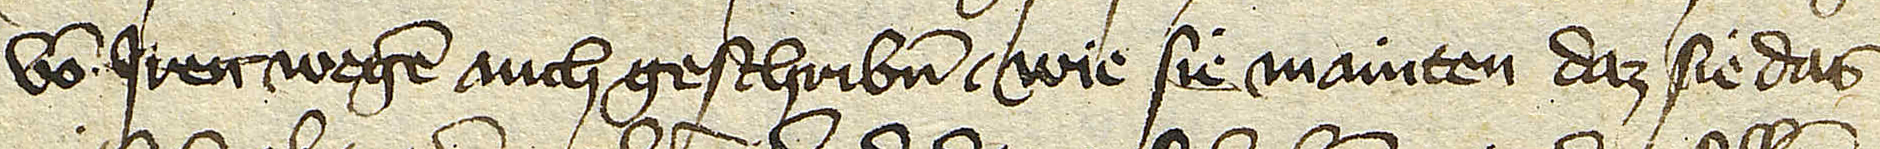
vo* Iren wege* auch geſchribn* / wie ſie mainten daʒ ſie das
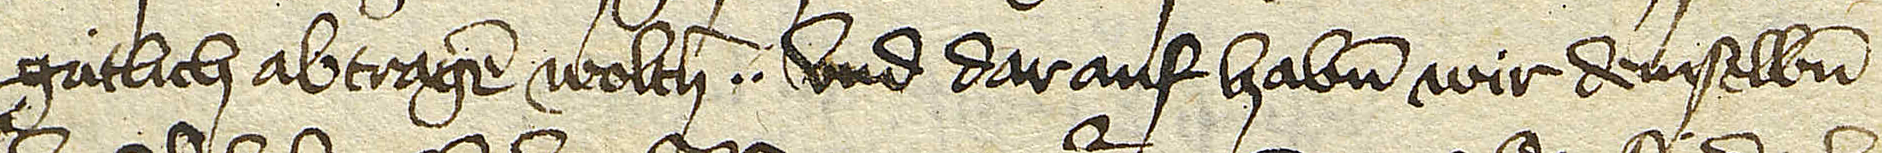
gütlich abtrage* woltn* . . vnd darauf habn* wir demſelbn*
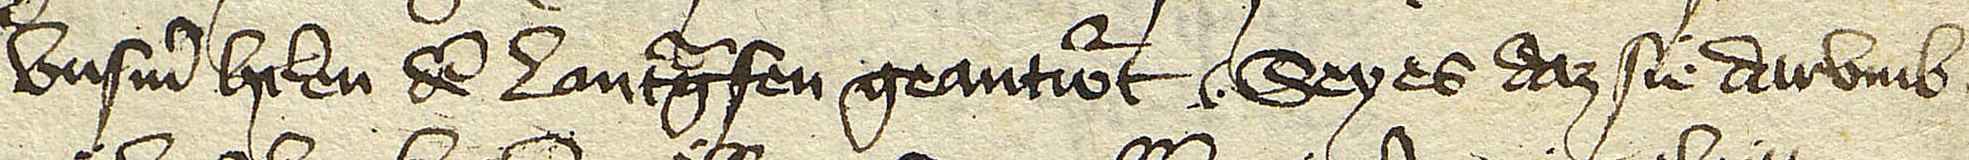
vnſm* hr*en d* Lantg*fen geantw*t / . Sey es daʒ ſie darvmb
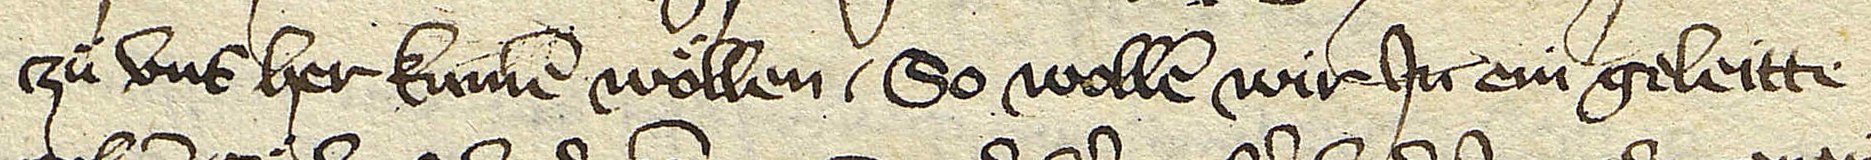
cʒü vns her kume* wöllen / So wolle* wir In ein geleitte
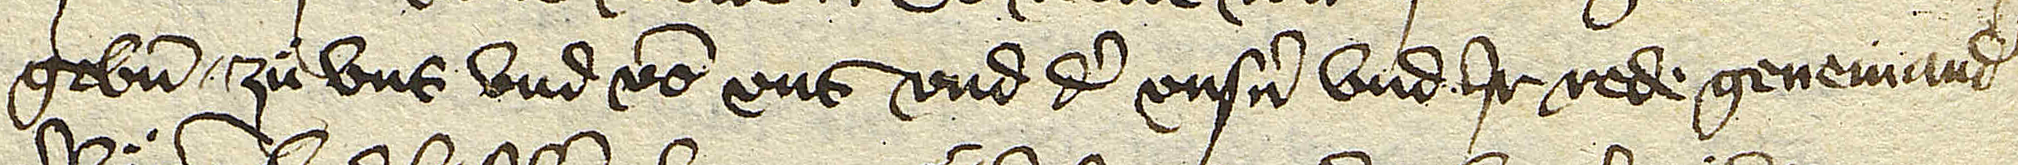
gebn* / cʒü vns vnd vo* vns vnd d* vnſn* Ir rede geneinand*
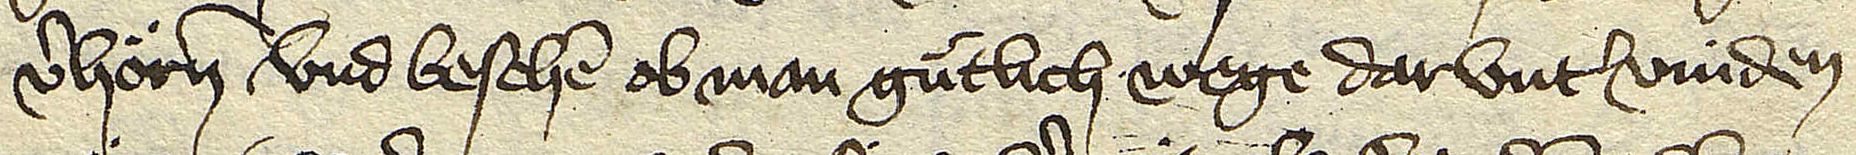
v*hörn* / vnd beſehe* ob man gütlich wege darvnt* vinden
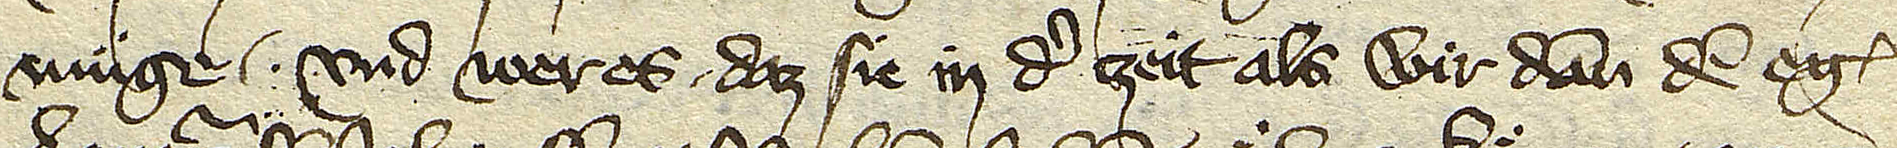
müge / . vnd wer es / daʒ ſie in d* cʒeit als wir dan* d* eg*
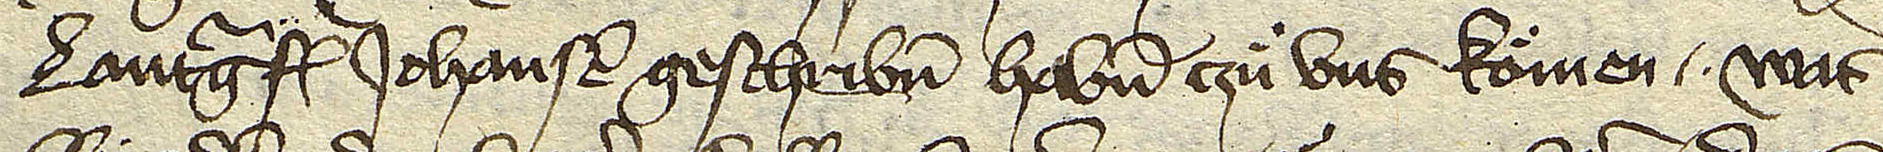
Lantg*f* Iohanſe* geſchribn* habn* cʒü vns kömen / . was
